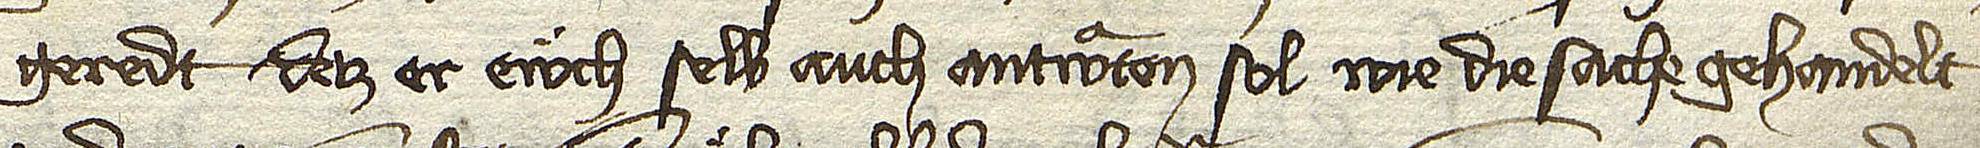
geredt / daʒ er ewch ſelb auch antw*ten ſol wie die ſache gehandelt
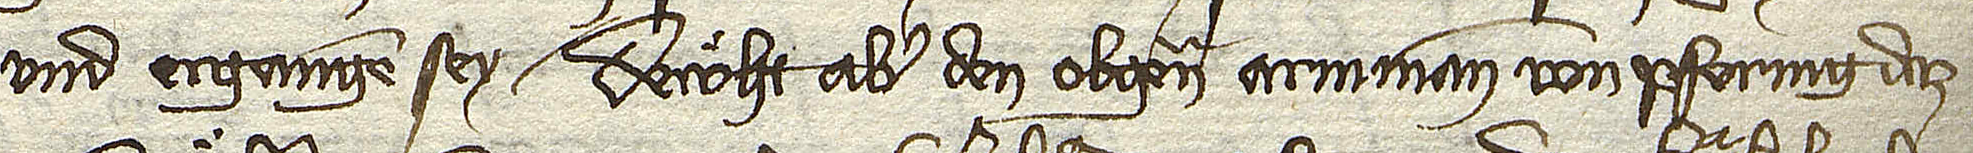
vnd ergange* ſey / Dewcht ab* den obgen* armman* von pfering daʒ
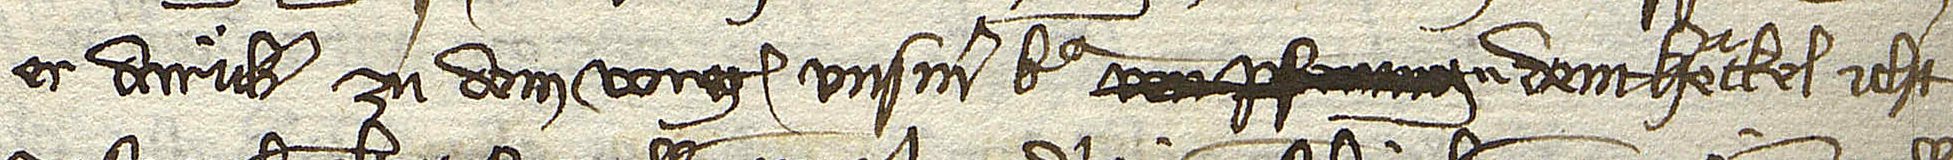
er darüb* ʒu dem vorg* vnſ*m b* von pfering ~ dem hëckel icht
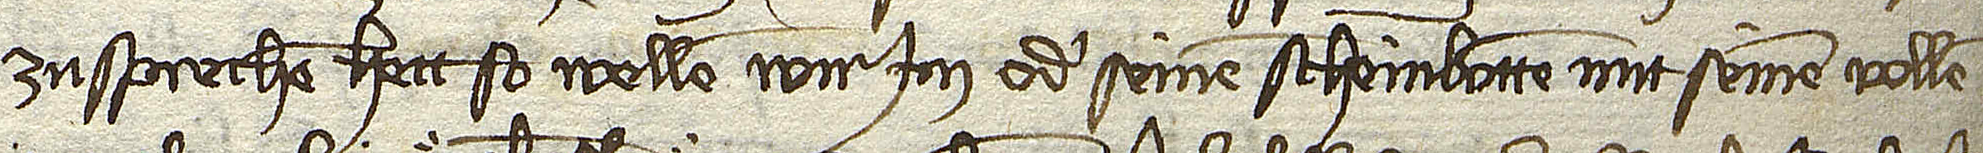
ʒuſpreche* hett ſo welle* wir In od* ſeine* ſcheinbotte* mit ſeine* volle*
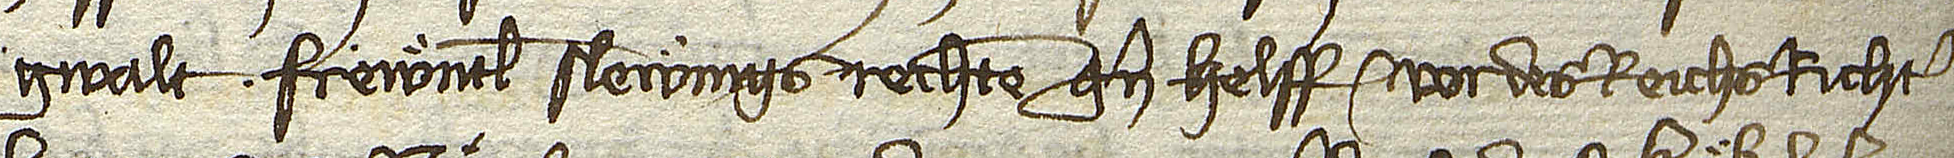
gwalt . frewntl* ſlewnigs rechte* g*n helff* vor des Reichs Richt*
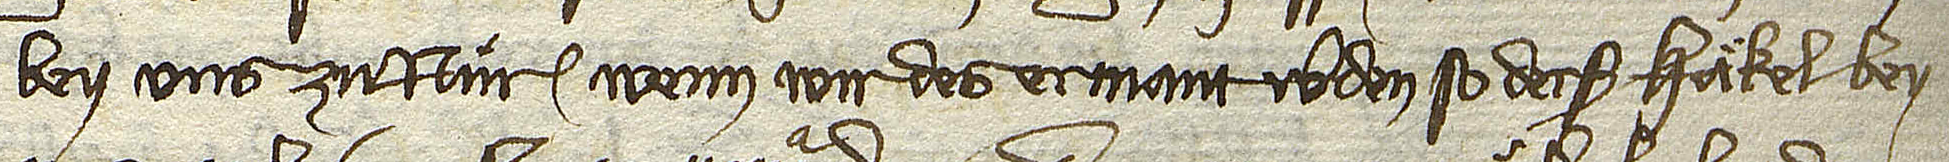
bey vns ʒu Nür* wenn wir des ermant w*den ſo derſ* häkel bey
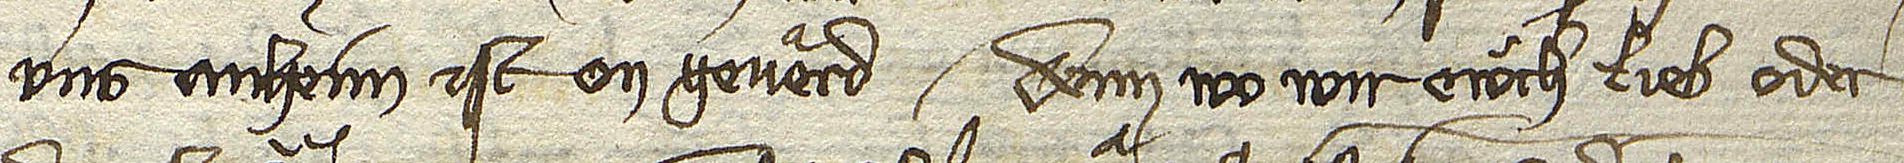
vns anheim iſt on geuërd / Denn wo wir ewch lieb oder
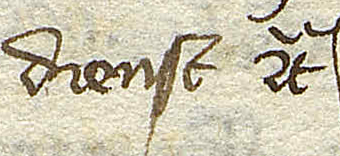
dienſt ec*
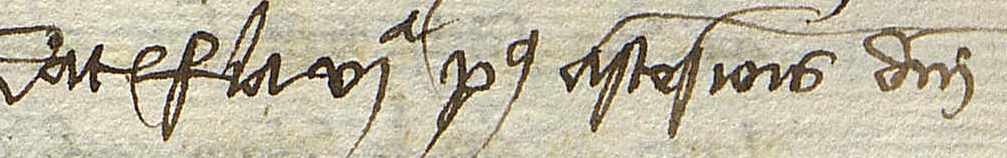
Dat* fia* vi* p* aſce*ſio*is dni*
